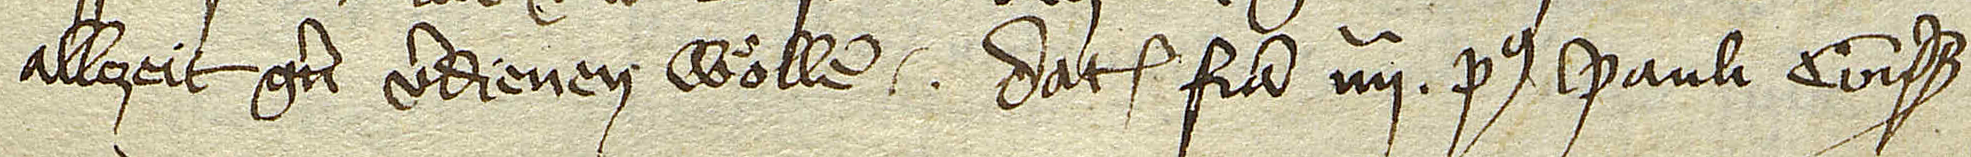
allcʒeit g*n v*dienen wölle* / . dat* fia* iiii*. p* Pauli Cou*ſ*
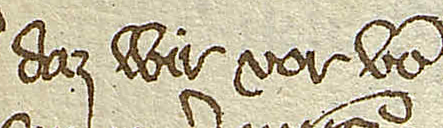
daʒ wir vor vo*
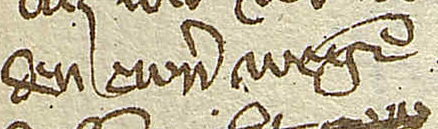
den ewn* wege*
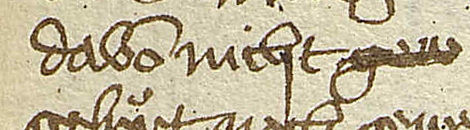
davo* nicht gew
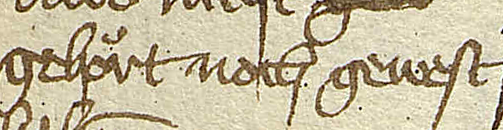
gehört noch geweſt
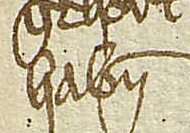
habn*
